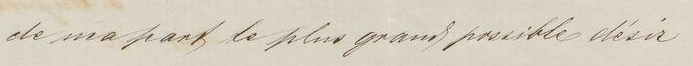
de ma part le plus grand possible désir
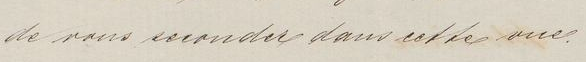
de vous seconder dans cette vue.
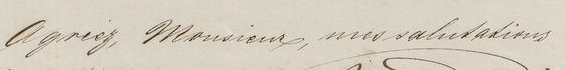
Agreez, Monsieur, mes salutations
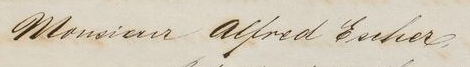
Monsieur Alfred Escher
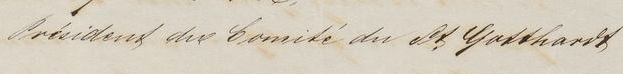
Président du Comité du St. Gotthardt
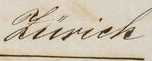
Zürich
